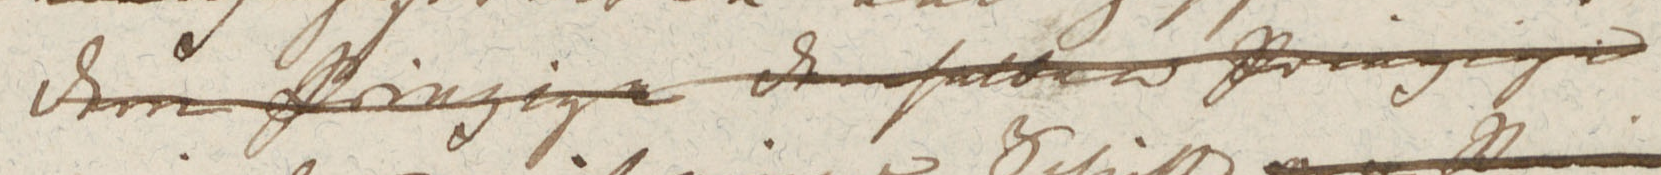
dem Prinzipe demselben Prinzipe
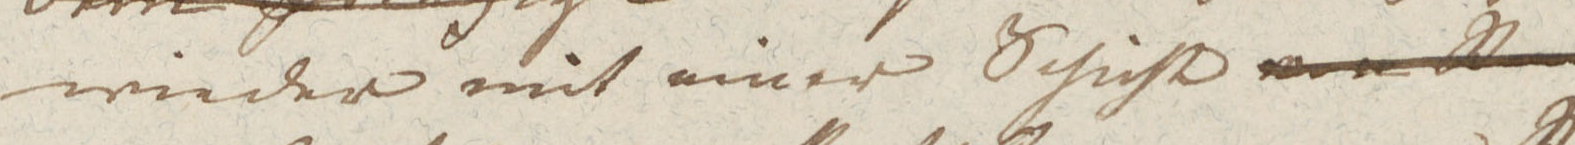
wieder mit einer Schicht von Stein
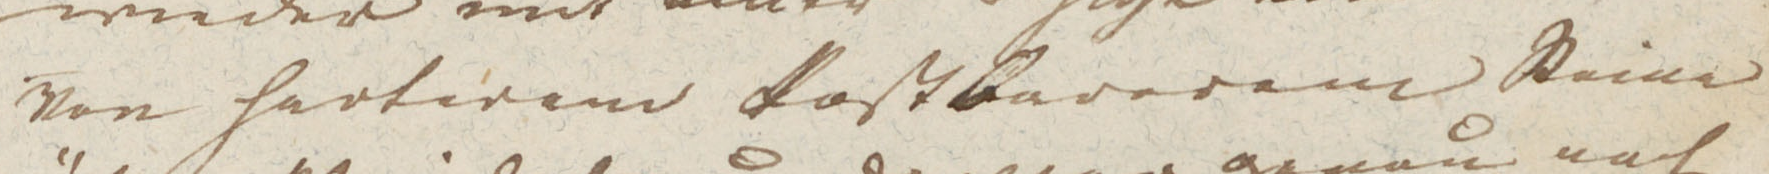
von harterem kostbarerem Steine
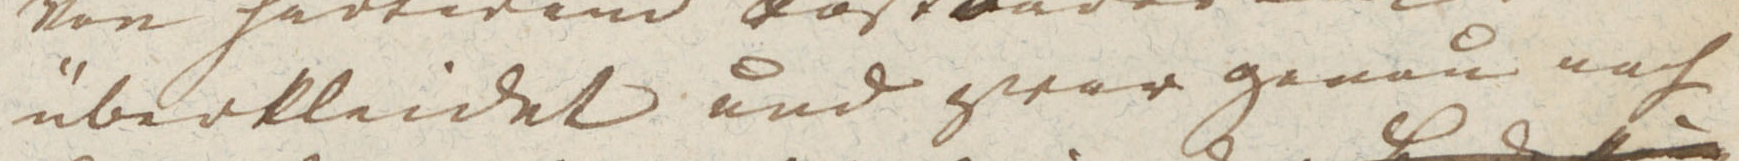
überkleidet und zwar genau nach
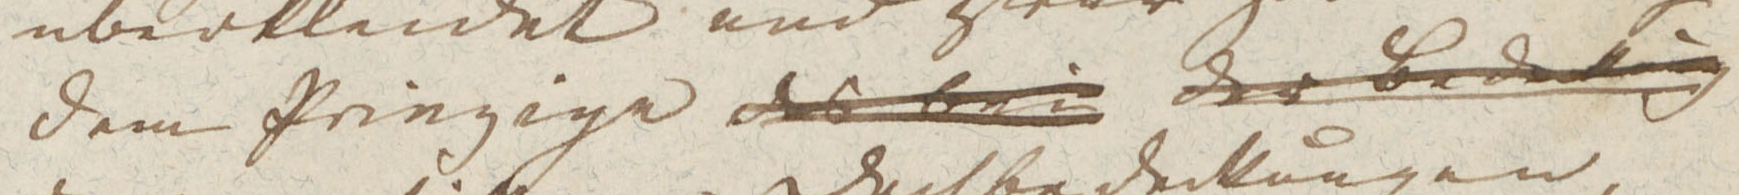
dem Prinzipe das bei der Bedeckung
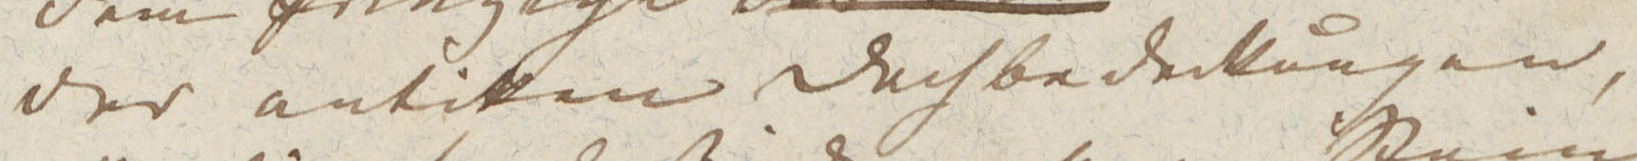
der antiken Dachbedeckungen,
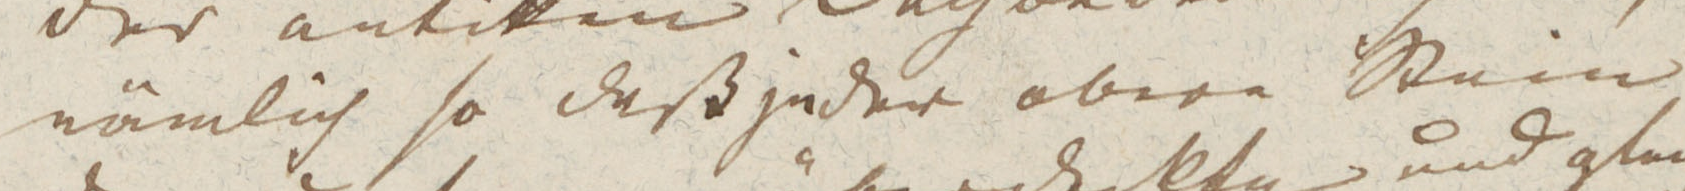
nämlich so dass jeder obere Stein
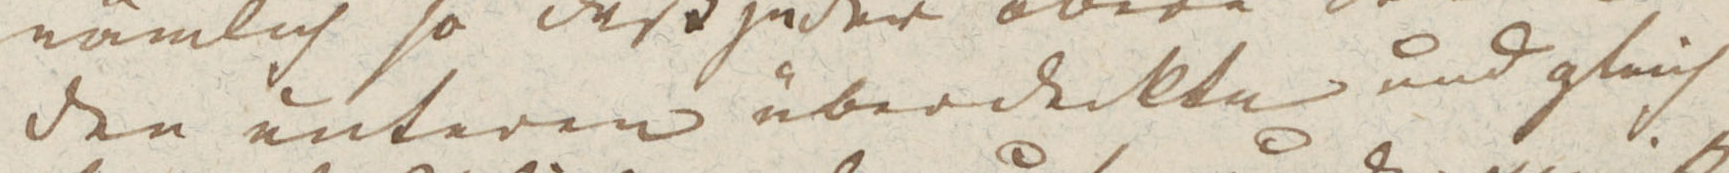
den unteren überdeckte und gleich
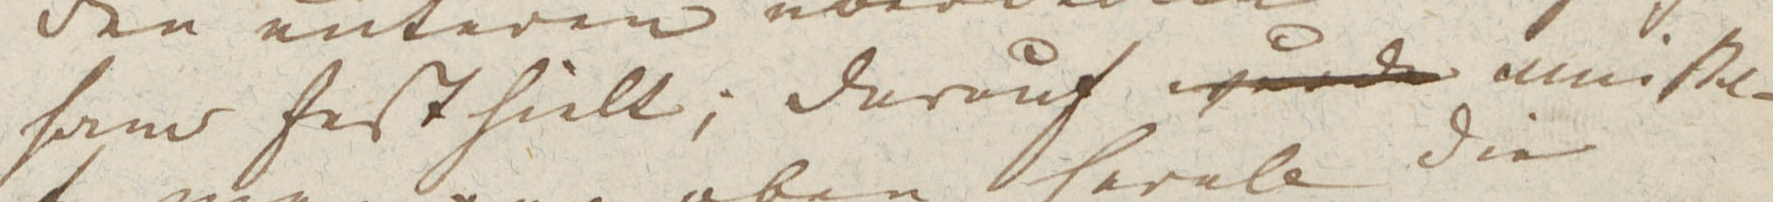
sam fest hielt; Darauf wurde meissel-
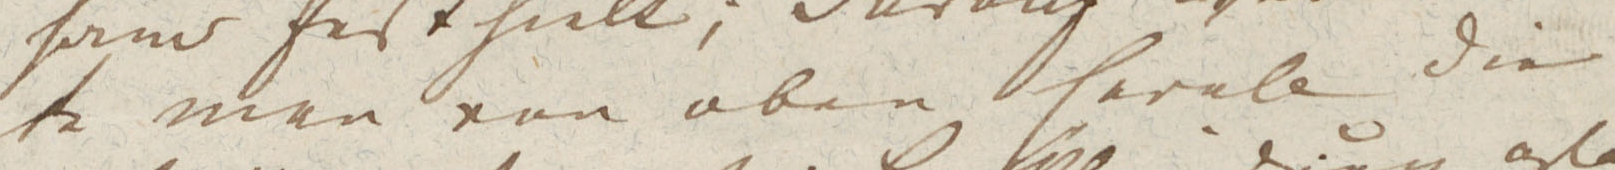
te man von oben herab die
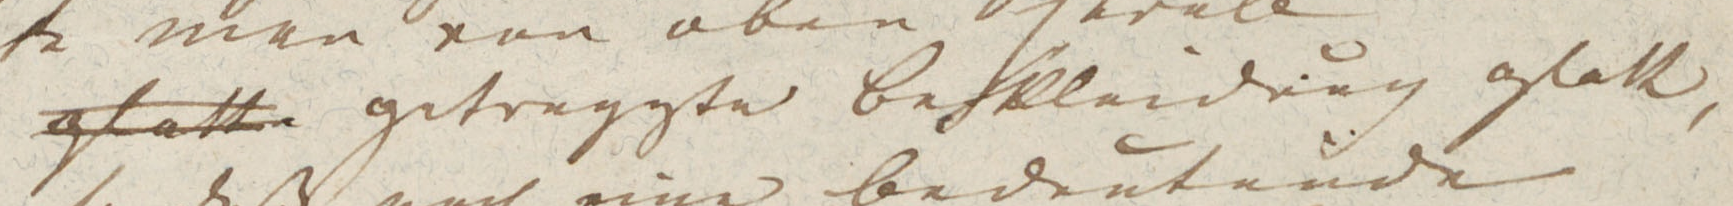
glatte getreppte Bekleidung glatt,
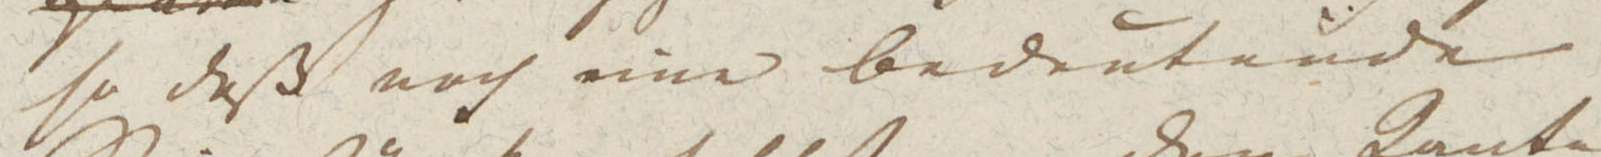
so dass noch eine bedeutende
